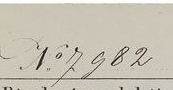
No. 7982
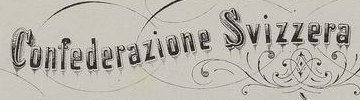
Confederazione Svizzera –
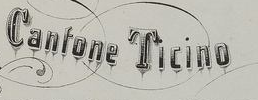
Cantone Ticino
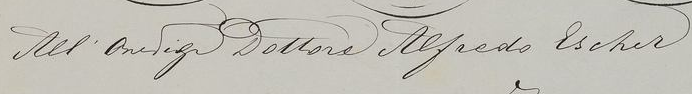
All' on. Sigr. Dottore Alfredo Escher
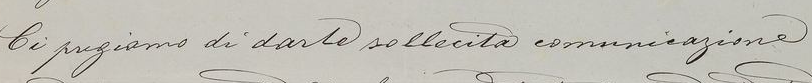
Ci pregiamo di darle sollecita communicazione
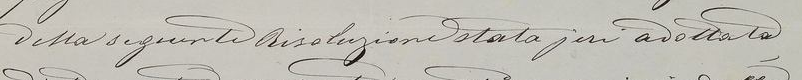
della seguente Risoluzione stata jeri adottata
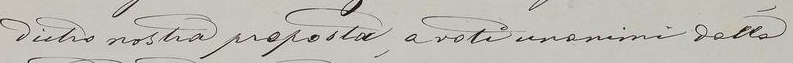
dietro nostra proposta, a voti unanimi dalla
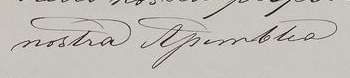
nostra Assemblea.
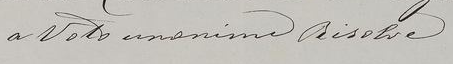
a Voto unanimo Risolve
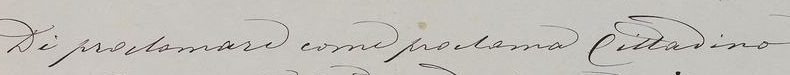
Di proclamare come proclama Cittadino
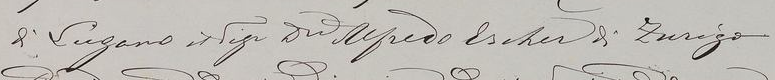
di Lugano il Sigr. Dr Alfredo Escher di Zurigo
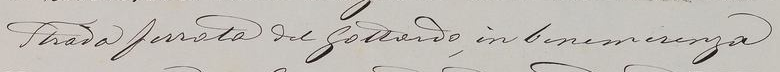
Strada ferrata del Gottardo, in benemerenza
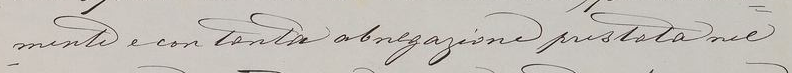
mente e con tanta abnegazione prestata nel
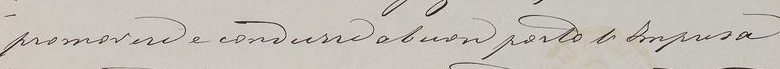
promovere e condurre a buon parto l'Impresa
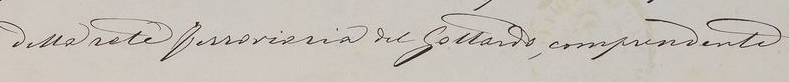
della rete ferroviaria del Gottardo, comprendente
